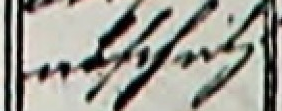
abschätz„
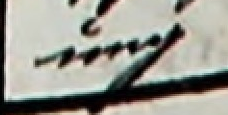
ung
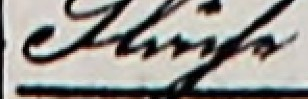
Fläche
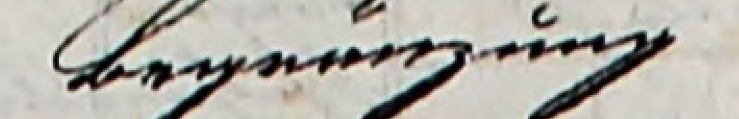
Begränzung
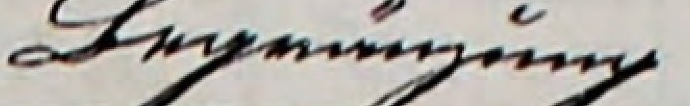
Begränzung
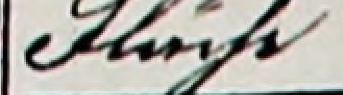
Fläche
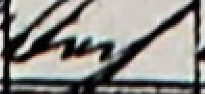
Tech
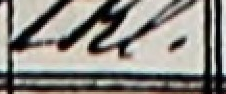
Ckl.
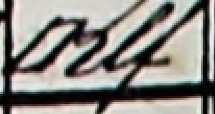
Cklf
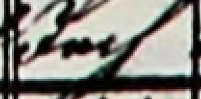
Tech
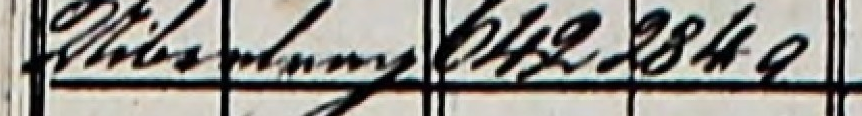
Uibertrag 642 2849
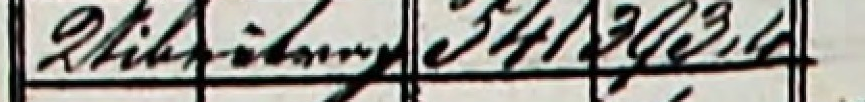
Uibertrag 541 393,4
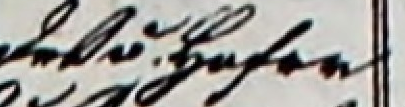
Des u. Hafer
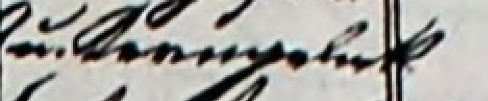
u. Krangelak
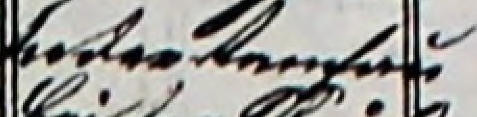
Inter Denchau
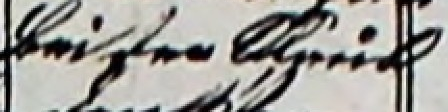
bei der Kaus
